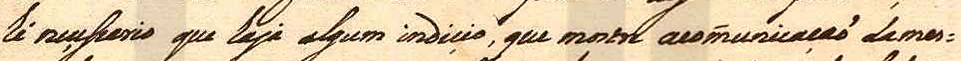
hé necessario que haja algum indicio, que mostre a com̄unicaçaõ da mes
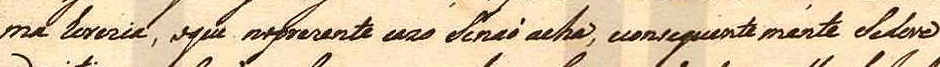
ma herezia, o que no prezente cazo Senaõ acha, e consequentemente Se deve
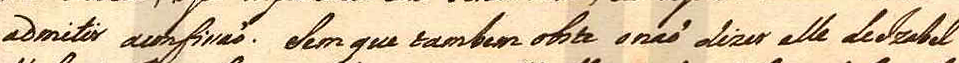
admitir a confissaõ. Sem que tambem obste o naõ dizer elle de Izabel
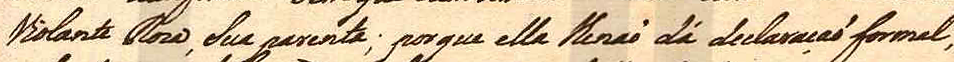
Violante Roza Sua parenta; porque ella lhe naõ dá declaraçaõ formal,
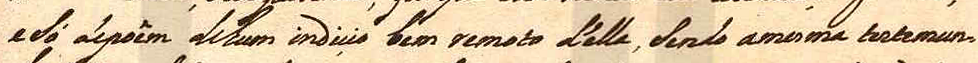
e Só depoêm de hum indicio bem remoto d'ella, sendo a mesma testemun
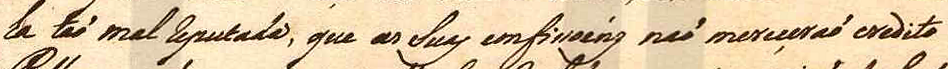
ha taõ mal Reputada, que as Suas cofissoenz naõ mereçeraõ credito
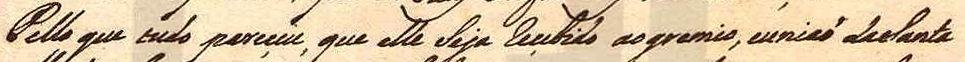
Pello que tudo pareceu, que elle seja Recebido ao gremio, e uniaõ da Santa
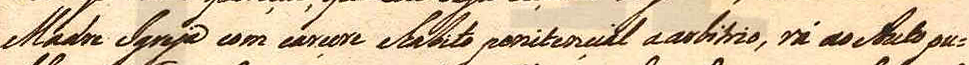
Madre Igreja com carcere e habito penitencial a arbitrio, vá ao Auto pu
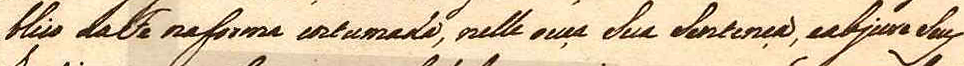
blico da Fe na forma costumada, nelle ouça Sua Sentença, e abjure seus
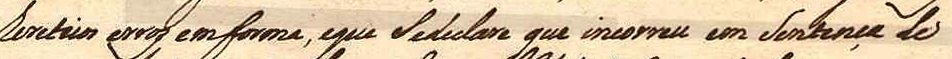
hereticos erroz em forma, e que Se declara que incorreu em Sentença de
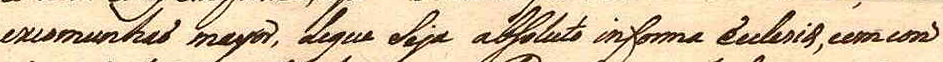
excomunhaõ mayor, de que Seja absoluto in forma Ecclesiæ, e em con
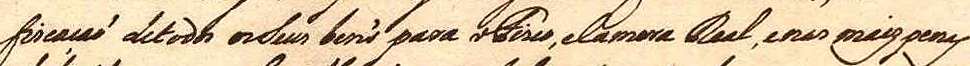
fiscaçaõ de todos os Seus bens para o Fisco, e Camera Real, e nas mais penas
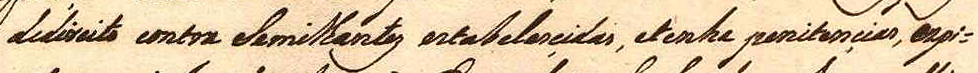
de direito contra Semilhantes estabelescidas, e tenha penitencias, ezpi
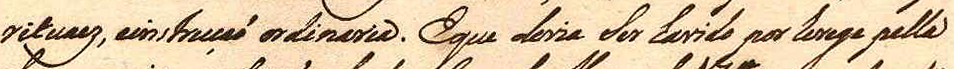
rituaez, e instruçaõ ordinaria. E que devia Ser havido por herege pella
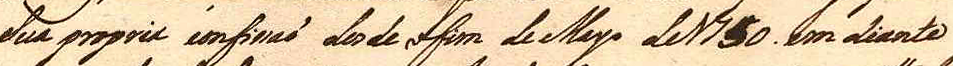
sua propria confissaõ desde o fim de Mayo de 1750. em diante
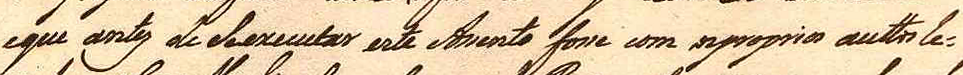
e que antes de Se executar este Assento fosse com os proprios auttos Le
